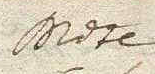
Mote
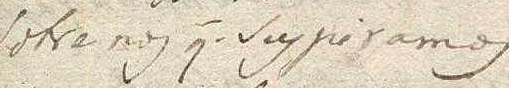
Sobre nos q̄ suspiramos
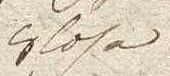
Glosa
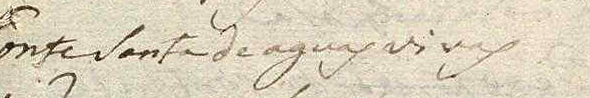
Fonte Santa de aguas vivas
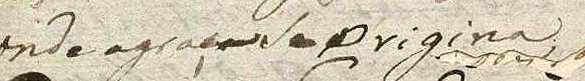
Onde a graça se Origina;
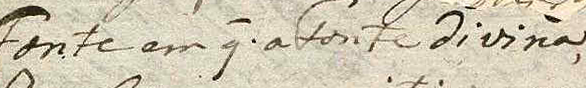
Fonte em q̄ a Fonte divina,
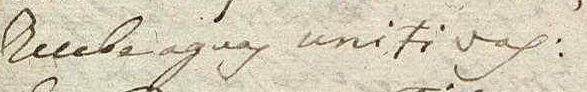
Recebe aguas unitivas:
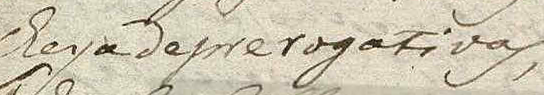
Cheya de prerogativas,
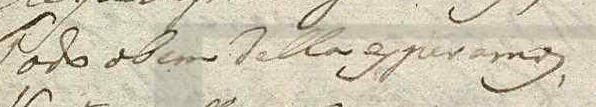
Todo o bem della esperamos,
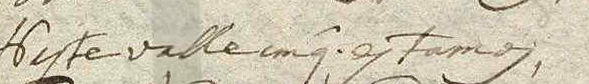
Neste valle em q̄ estamos,
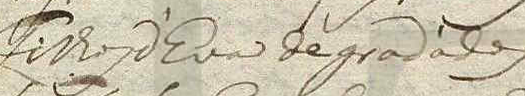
Filhos d'Eva degradados,
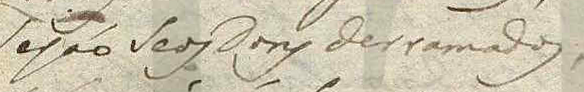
Sejaõ seos dons derramados
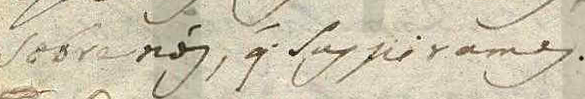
Sobre nós, q̄ suspiramos.
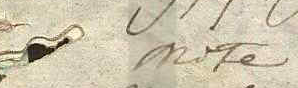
Mote
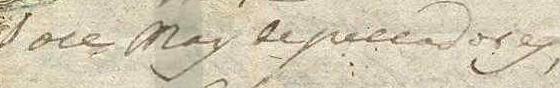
_oce May de peccadores,
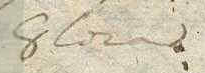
Gloza
